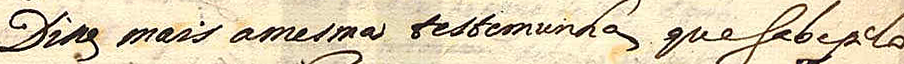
Disse mais a mesma testemunha que sabe pelo
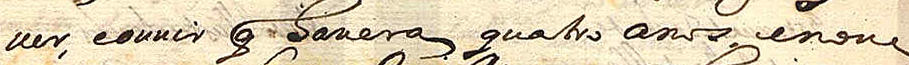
uer, e ouuir q̄ hauera quatro anos, e noue
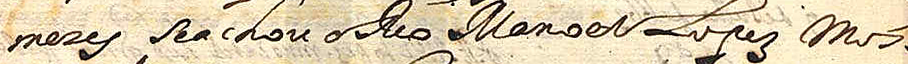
mezes se achou o Reo Manoel Lopez Mos
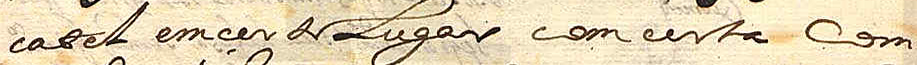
catel em çerto Lugar com certa Com
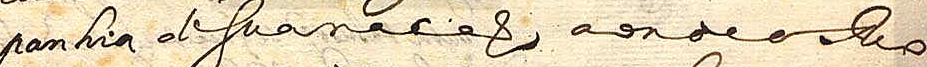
panhia de sua nacaõ aonde o Reo
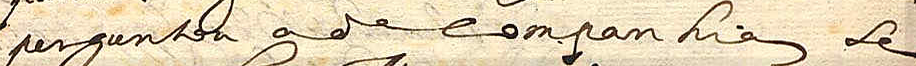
perguntou a da companhia se
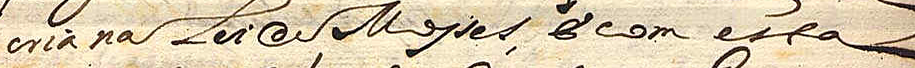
cria na Lei de Mojses, & com esta
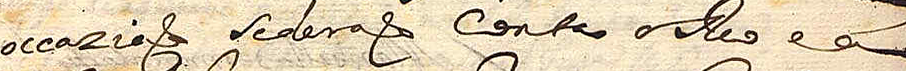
occaziaõ se deraõ conta o Reo e a
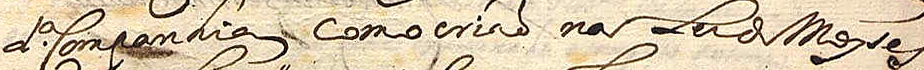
d.a Companhia como criaõ na Lei de Mojses
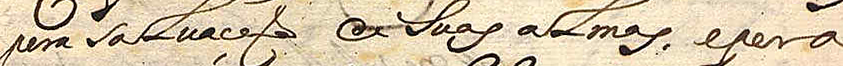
pera saLuaçaõ de Suas aLmas, e pera
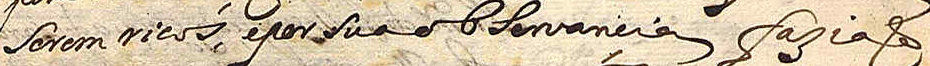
Serem ricos, e por sua obSeruançia faziaõ
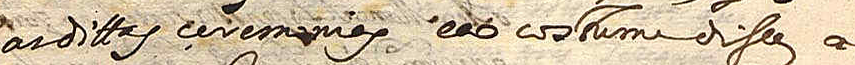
as dittas çeremonias e ao costume disse a
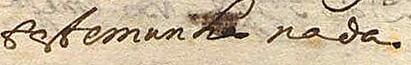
testemunha nada.
